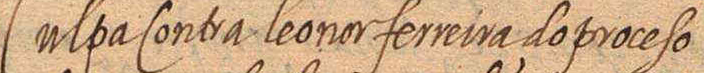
Culpa Contra leonor ferreira do proceso
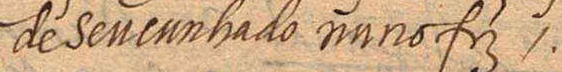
de seu cunhado nuno frz̅ /.
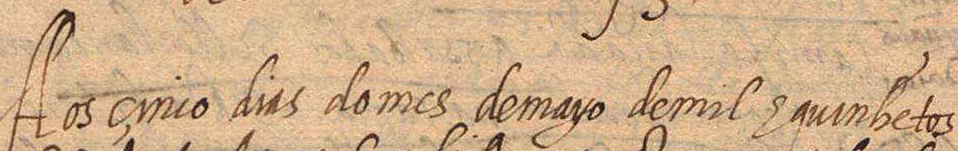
Aos çinco dias do mes de mayo de mil E quinhe̅tos
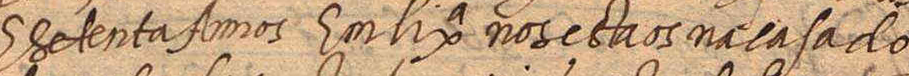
E setenta Annos Em lixa nos estaos na casa do
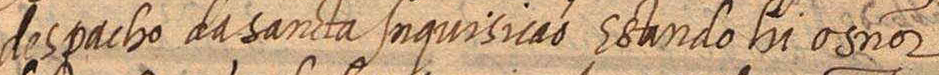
despacho da sancta Jnquisicão Estando hi o sn̅or
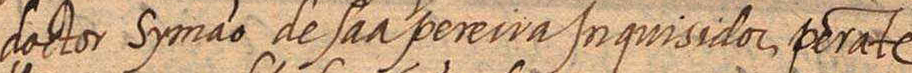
doctor Symão de saa pereira Jnquisidor pe̅rate
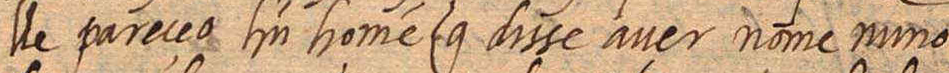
lle pareçeo hu̅ home̅ q̅ disse auer nome nuno
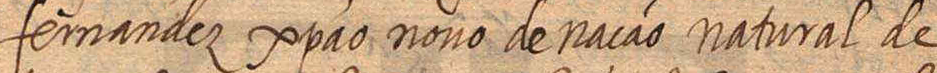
fernandez xpão nouo de nação natural de
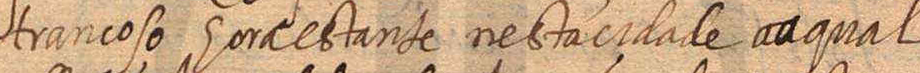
trancoso E ora estante nesta cidade aa qual
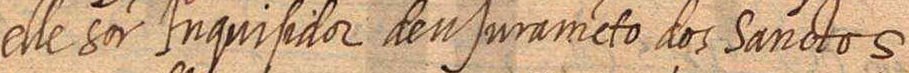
elle so̅r Jnquisidor deu Jurame̅to dos Sanctos
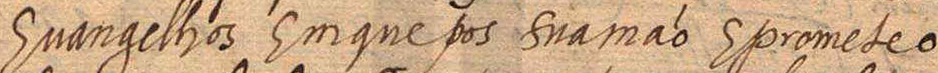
Euangelhos Em que pos sua maõ E prometeo
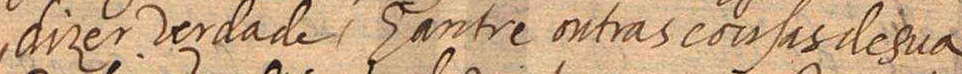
dizer verdade, E antre outras cousas de sua
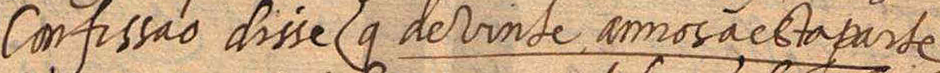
confissão disse q̅ de vinte annos a esta parte
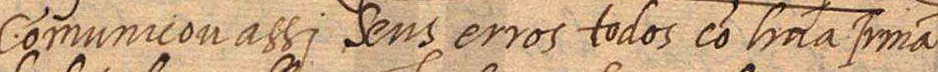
co̅municou assj Seus erros todos co̅ hu̅a jrmã
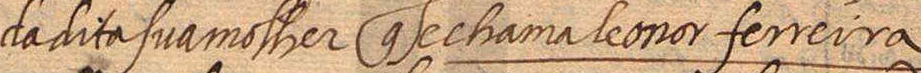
da dita sua molher q̅ se chama leonor ferreira
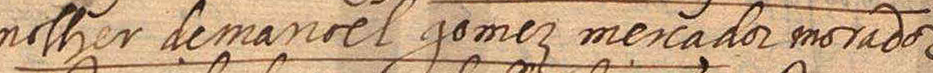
molher de manoel gomez mercador morador
